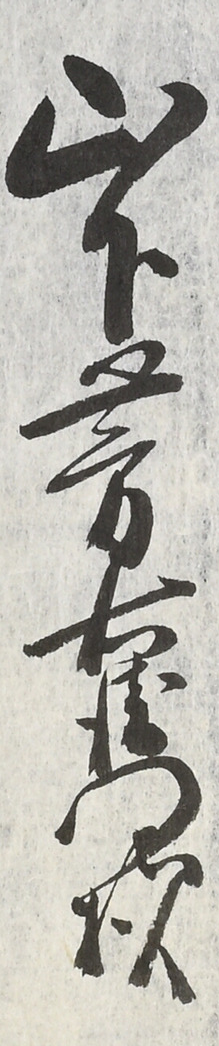山下芳右衛門様
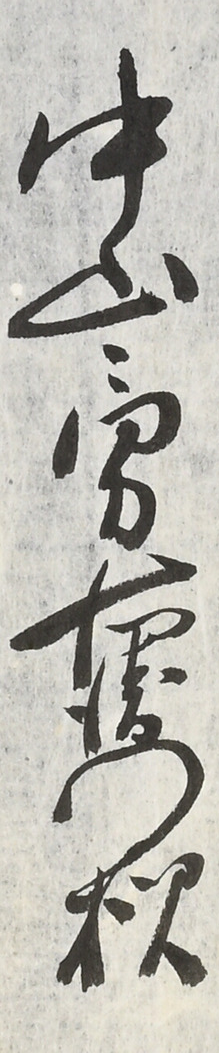中山勇右衛門様
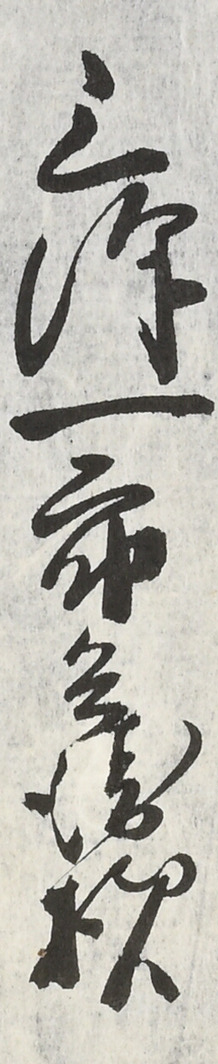三沢一郎兵衛様
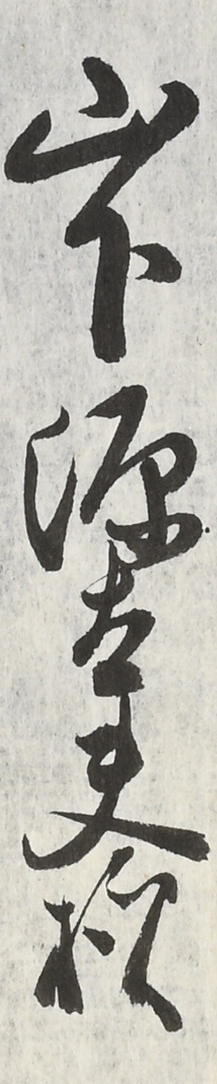山下源太夫様
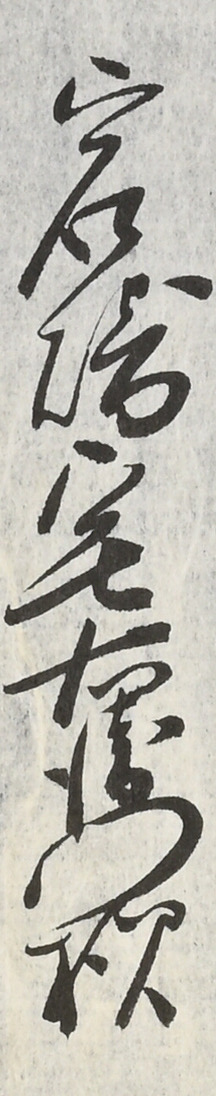岩崎宅右衛門様
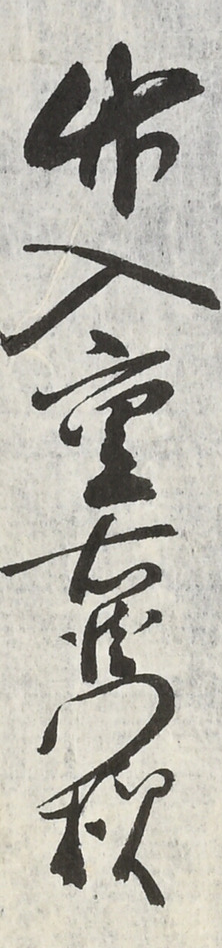竹入重右衛門様
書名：覚
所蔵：伊那市立高遠町図書館・合同会社AMANE
